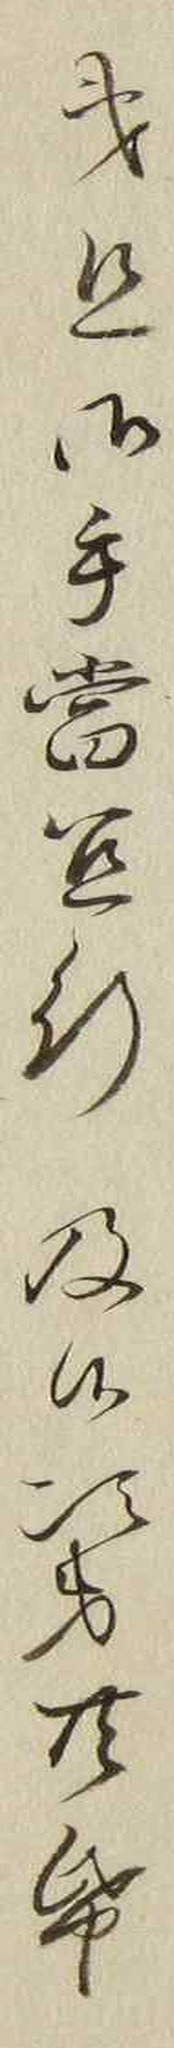第且御手当宜行及候次第共紙
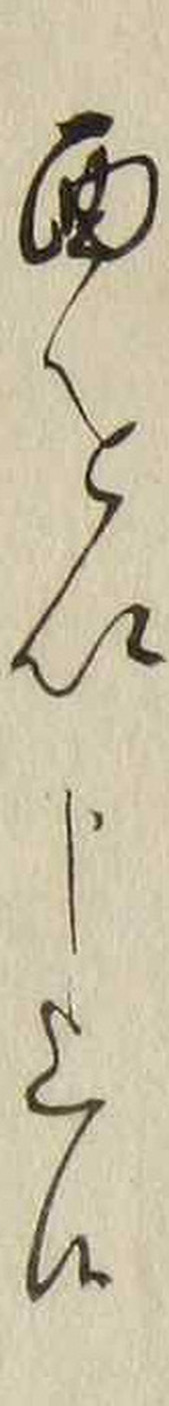面を以申上候
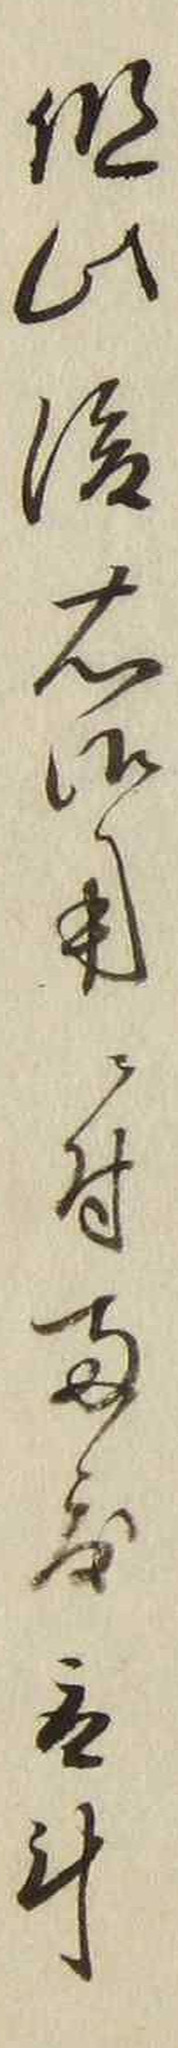但此後右御用ニ付両度取計

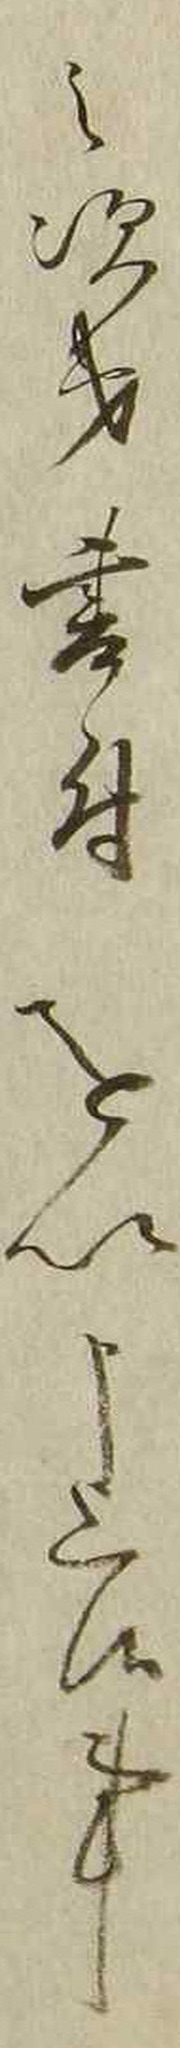之次第書付を以申上候事
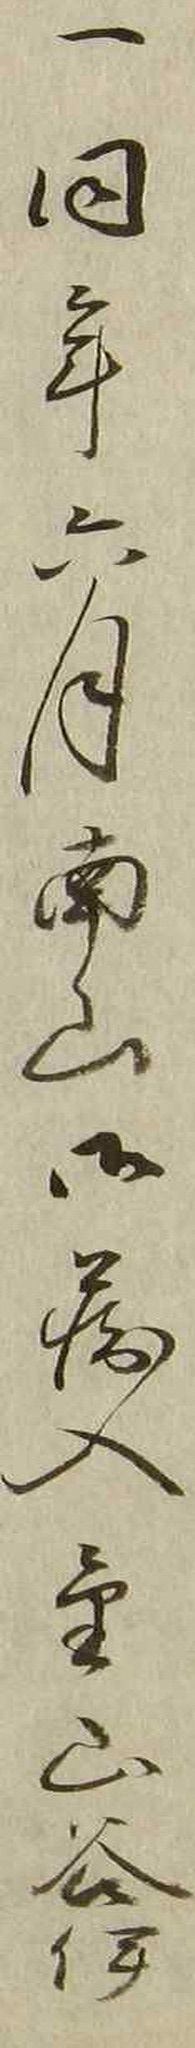一同年六月南山御蔵入金山谷伊
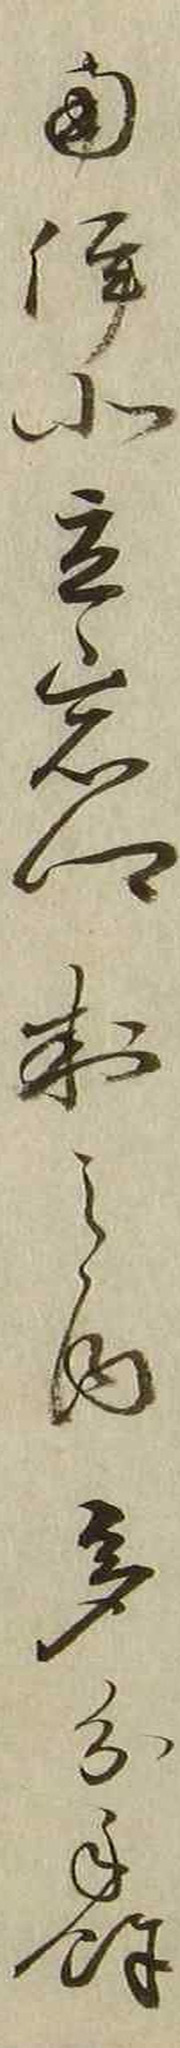南伊北立岩郷村之内多分手余
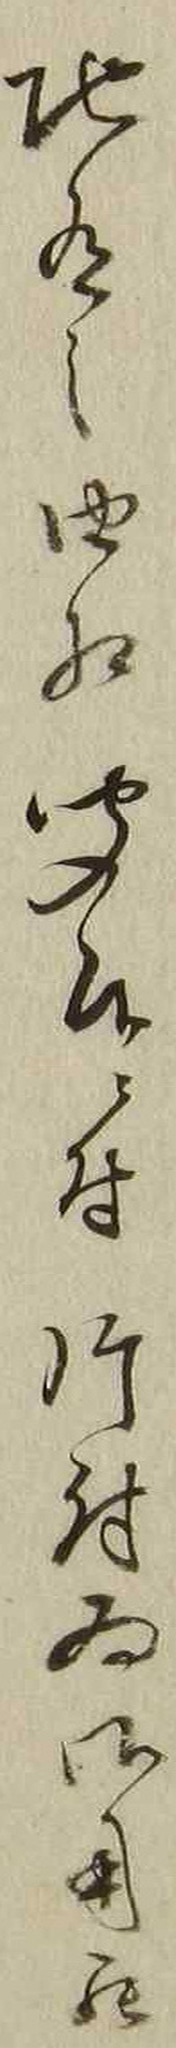地有之由相聞候ニ付片付為御用罷
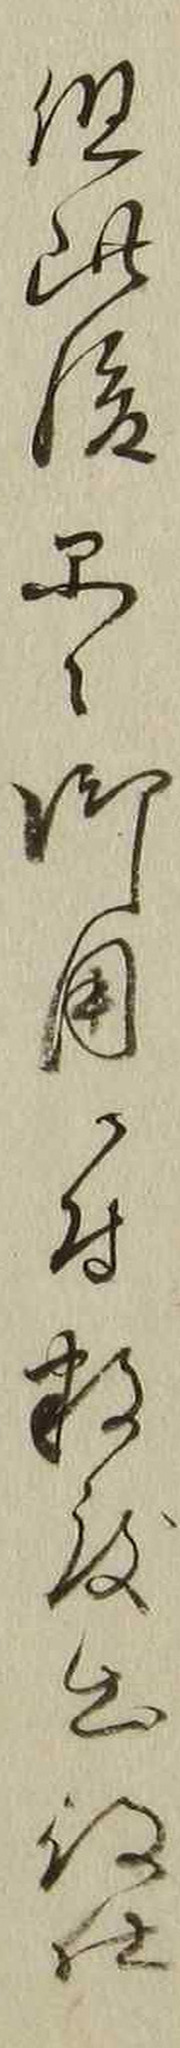但此後品々御用ニ付数度出役仕
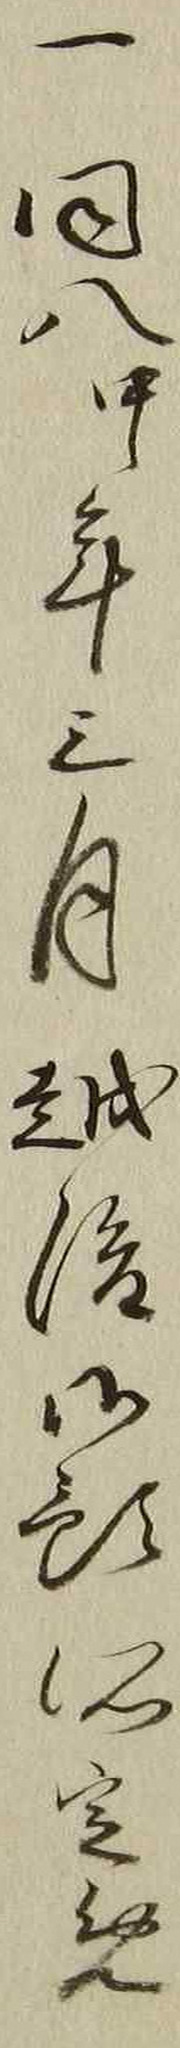一同八申年三月越後御預所定免
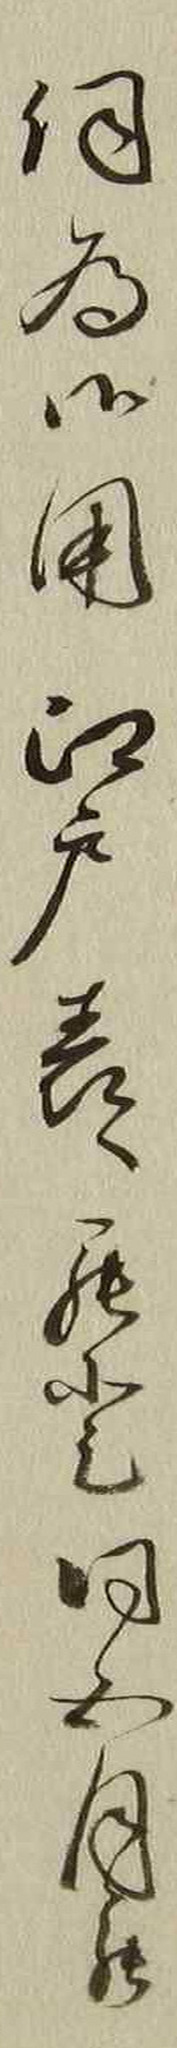伺為御用江戸表へ罷登同五月罷
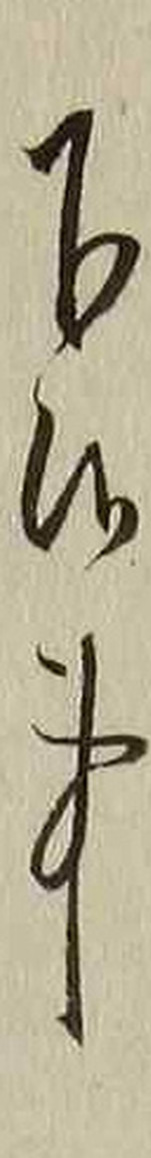下候事
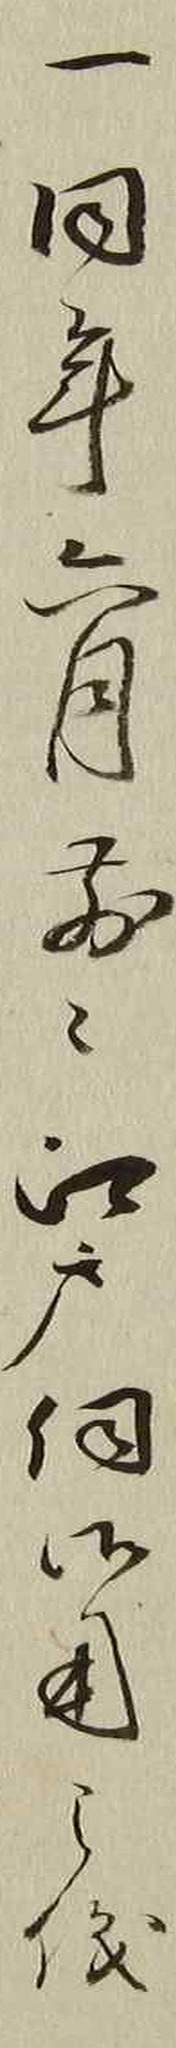一同年六月前々江戸伺御用之儀
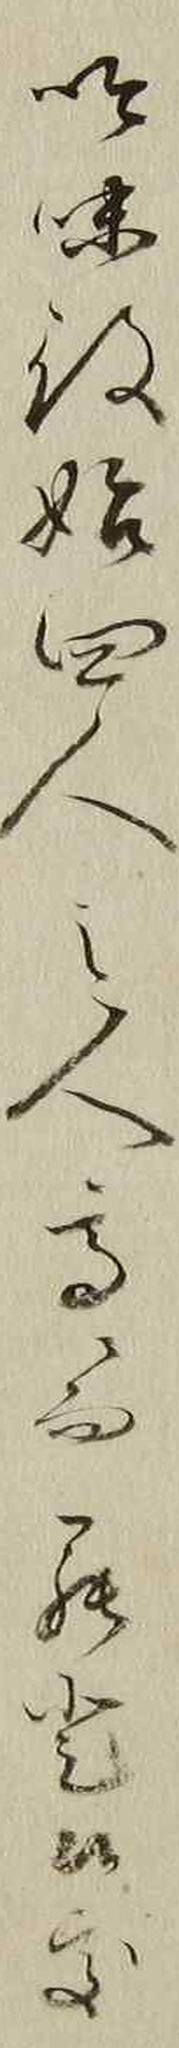吟味役始四人之人高ニ而罷登候処
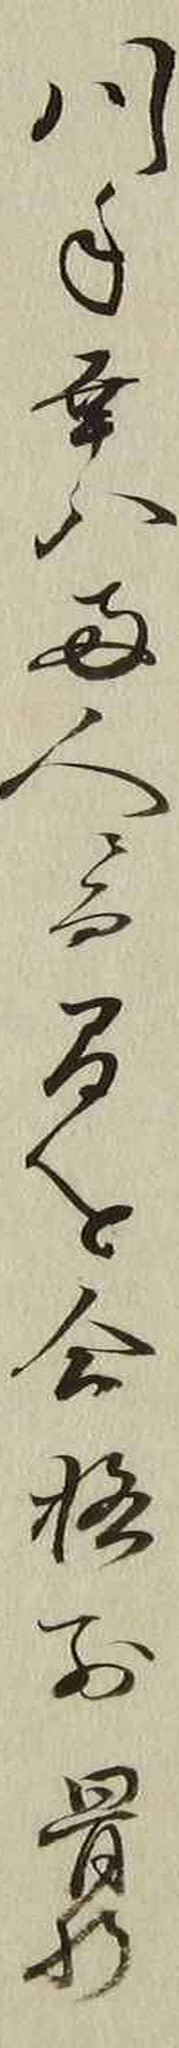川手幸八両人ニ而間を合格別骨折
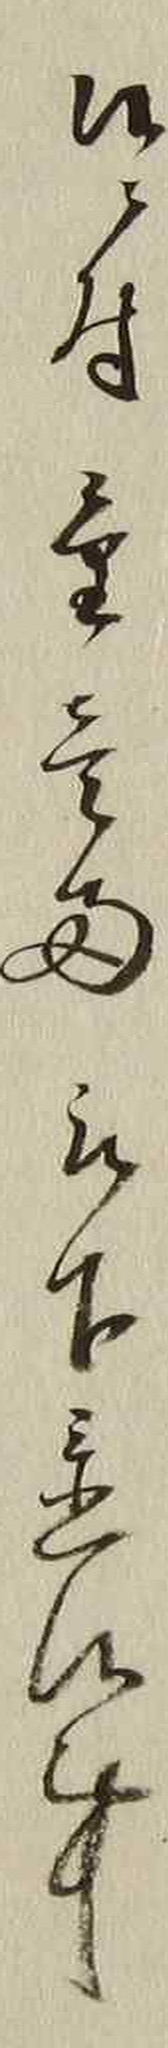候ニ付金壱両被下置候事
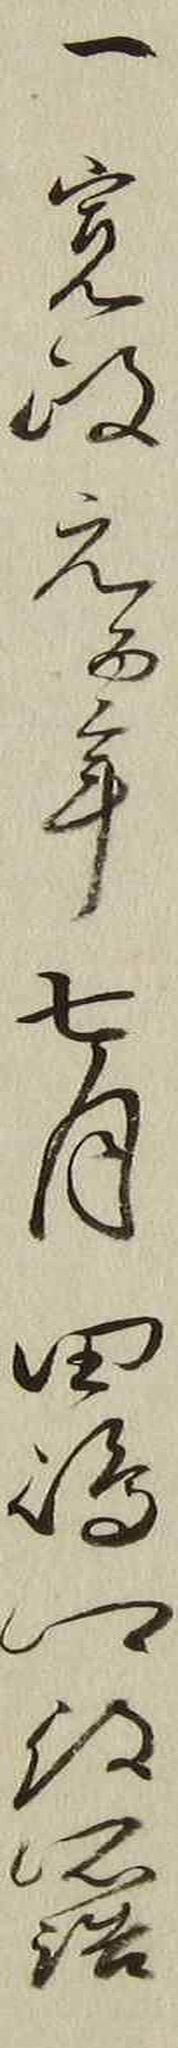一寛政元酉年七月田嶋郷役所詰
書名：諸士系譜　巻之52　に之部3
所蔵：会津若松市立会津図書館
